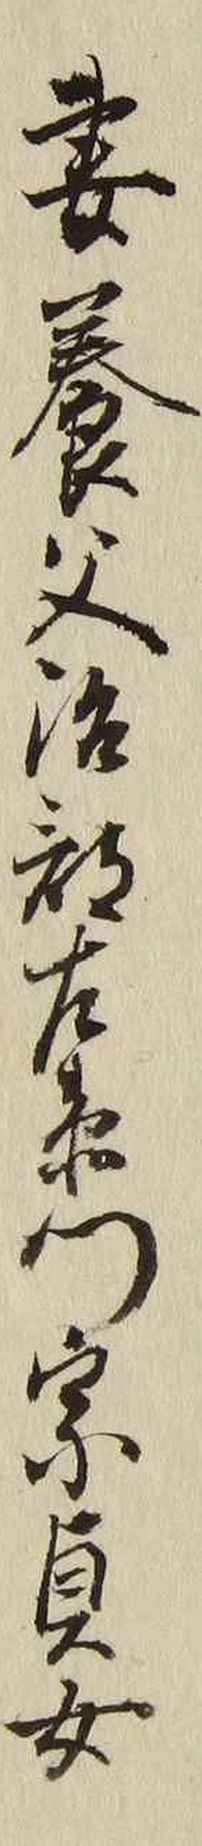妻養父治部左衛門宗貞女

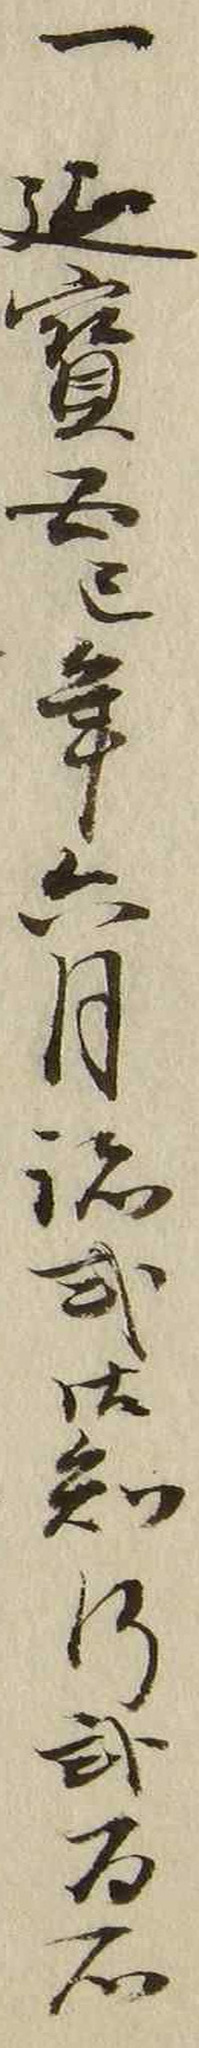一延宝五巳年六月跡式御知行弐百石
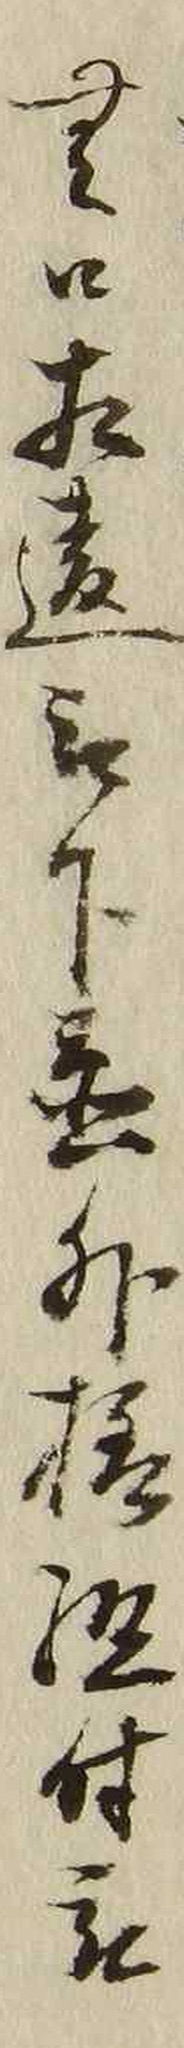無御相違被下置外様組付被
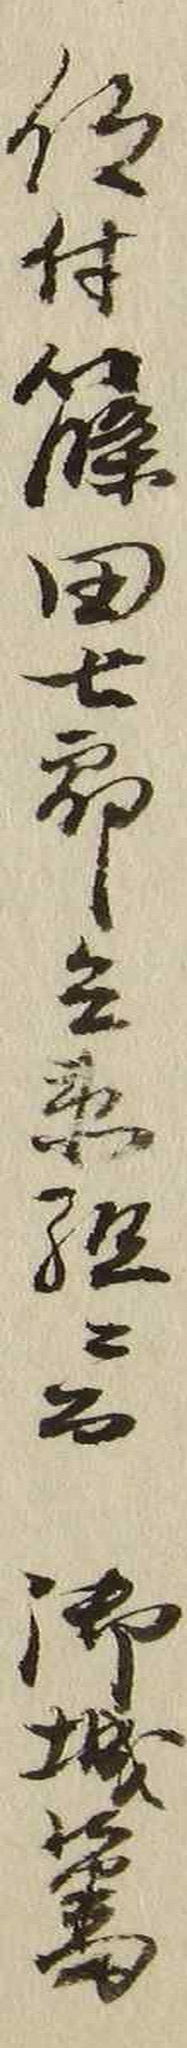仰付篠田七郎兵衛組ニ而御城御番
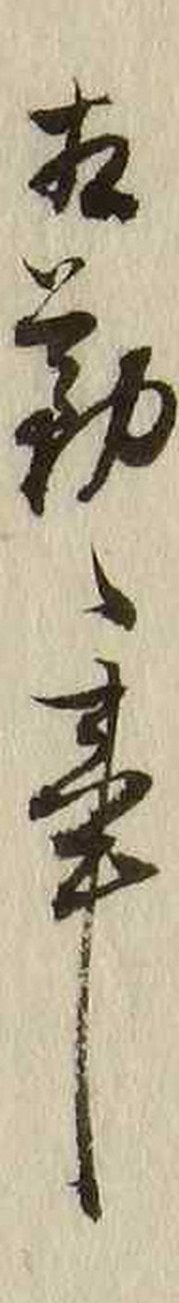相勤候事
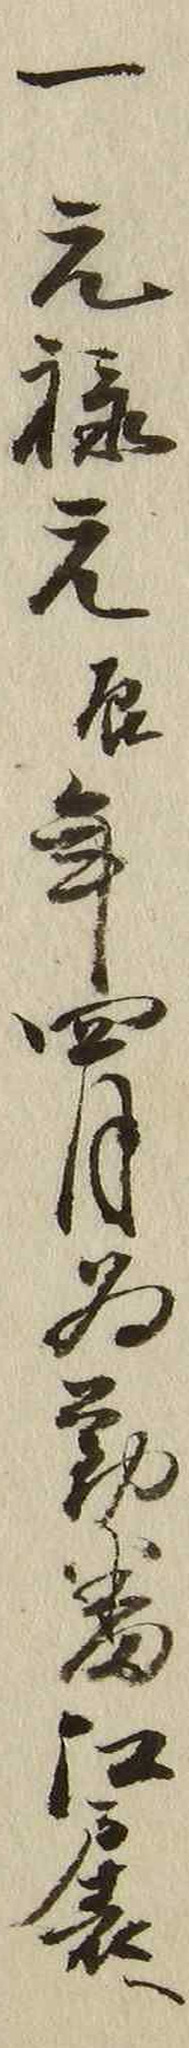一元禄元辰年四月為勤番江戸表へ
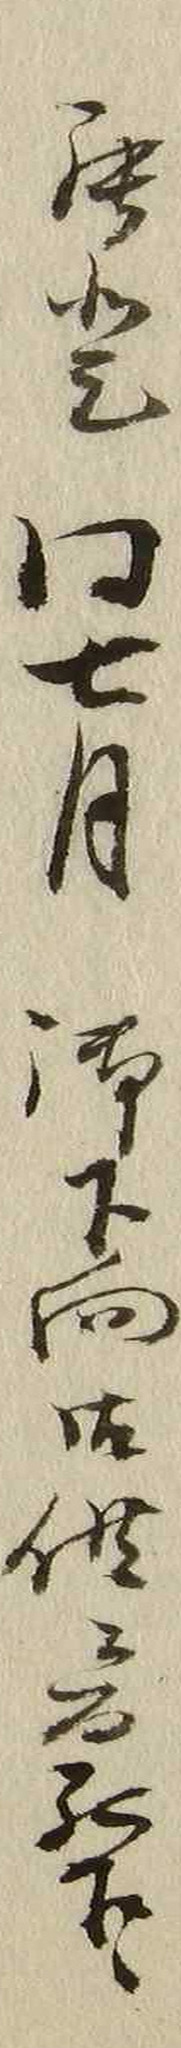罷登同七月御下向御供ニ而罷下候
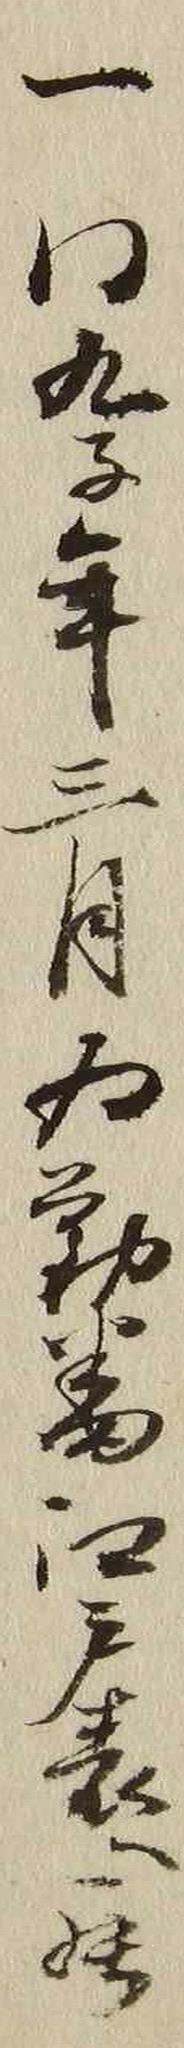一同九子年三月為勤番江戸表へ罷
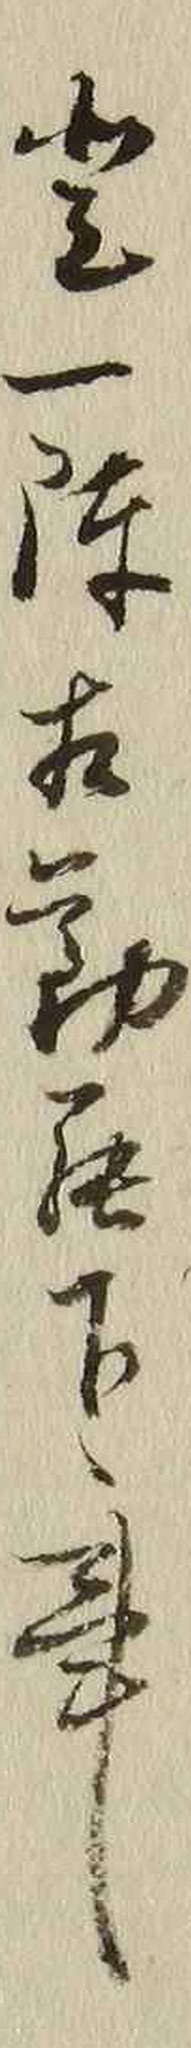登一陣相勤罷下候事
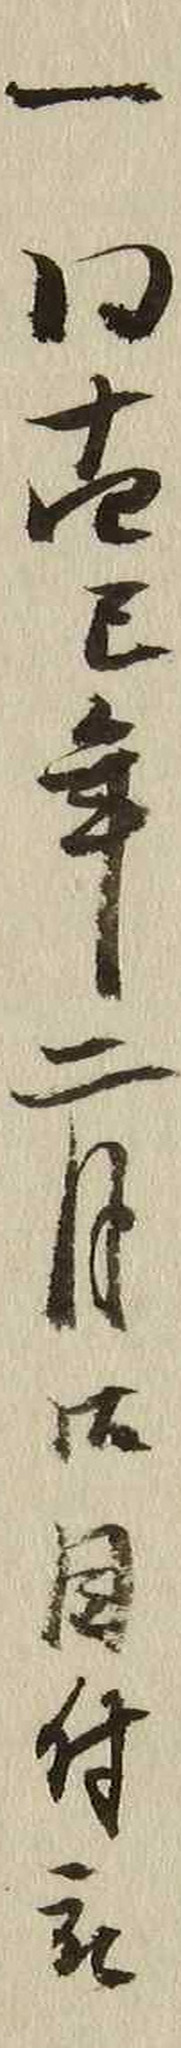一同十四巳年二月御目付被
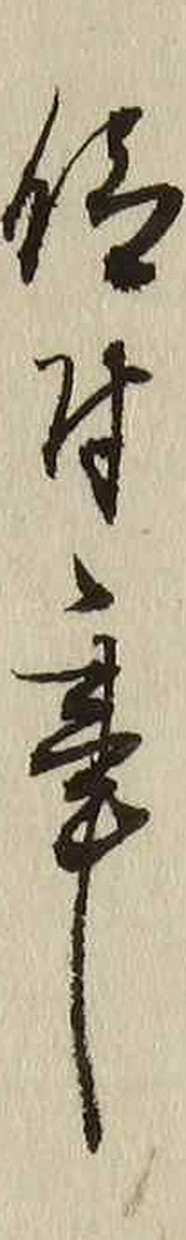仰付候事
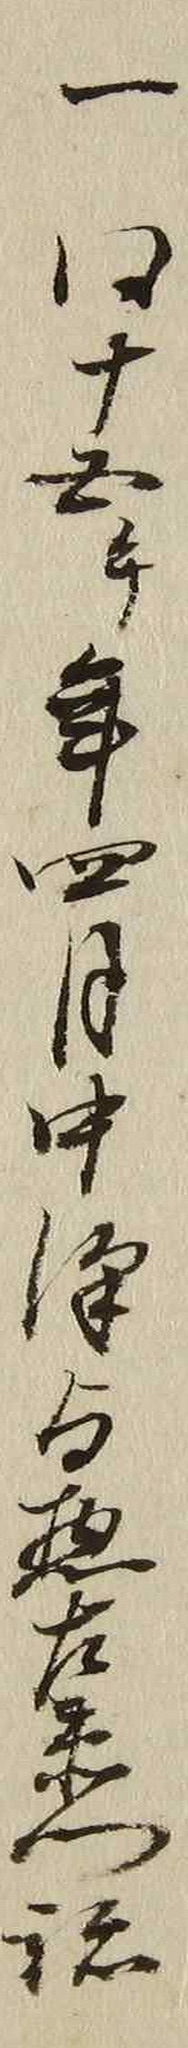一同十五午年四月中沢与惣左衛門跡
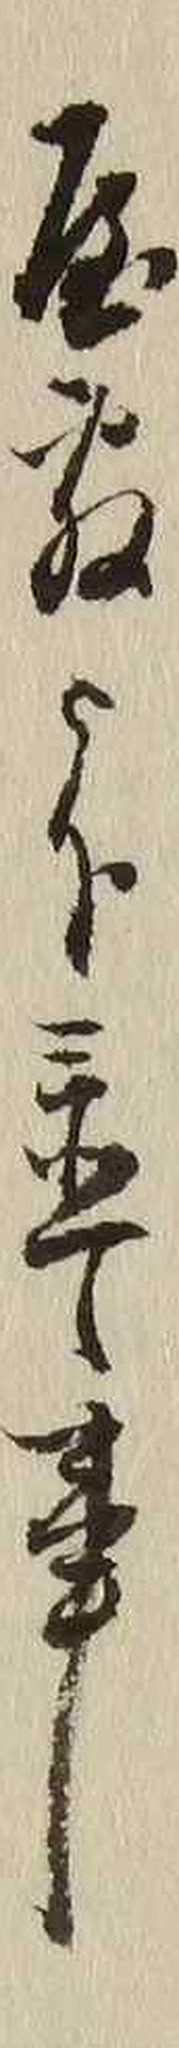屋敷被下置候事
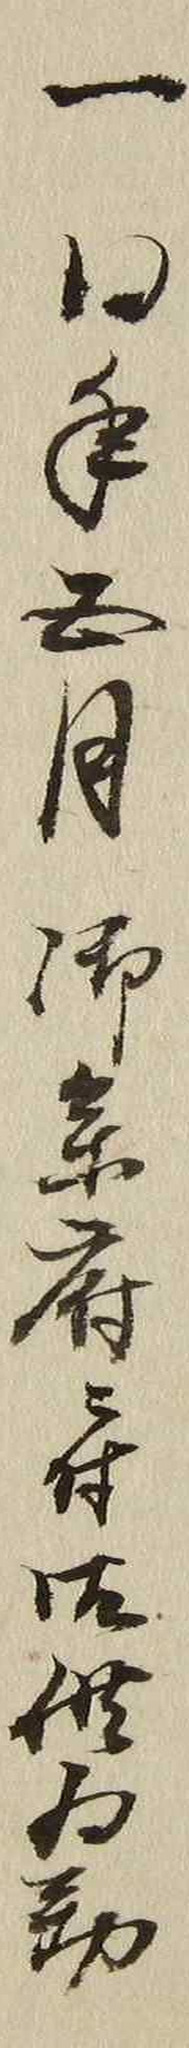一同年五月御参府ニ付御供為勤
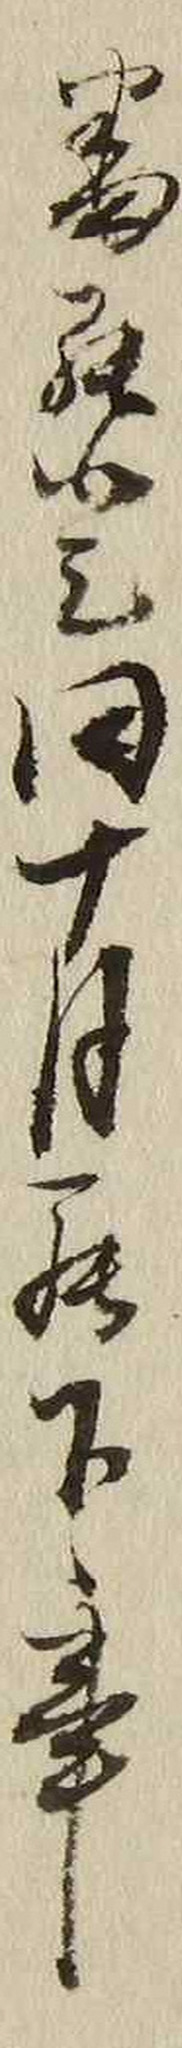番罷登同十月罷下候事
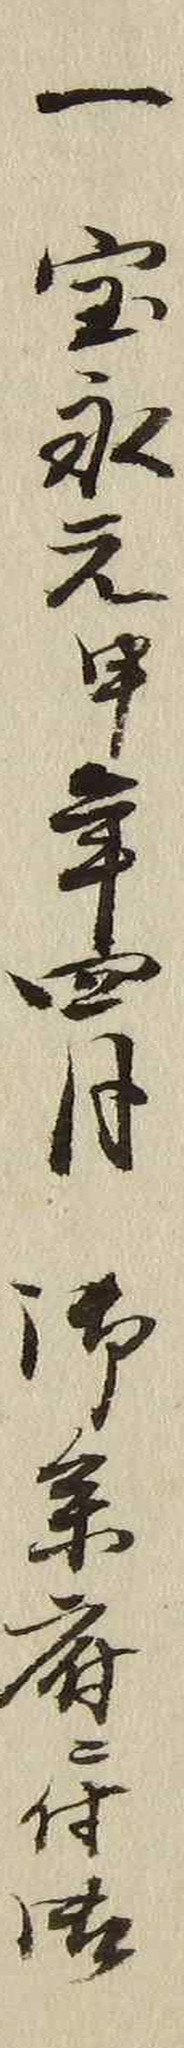一宝永元申年四月御参府ニ付御
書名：諸士系譜　巻之348　も之部4
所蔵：会津若松市立会津図書館
